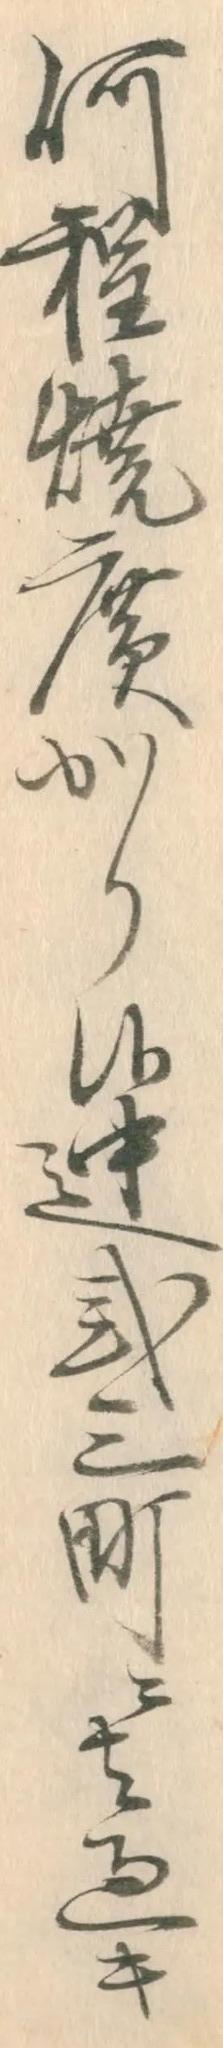何程焼広がり候迚弐三町ニは過キ
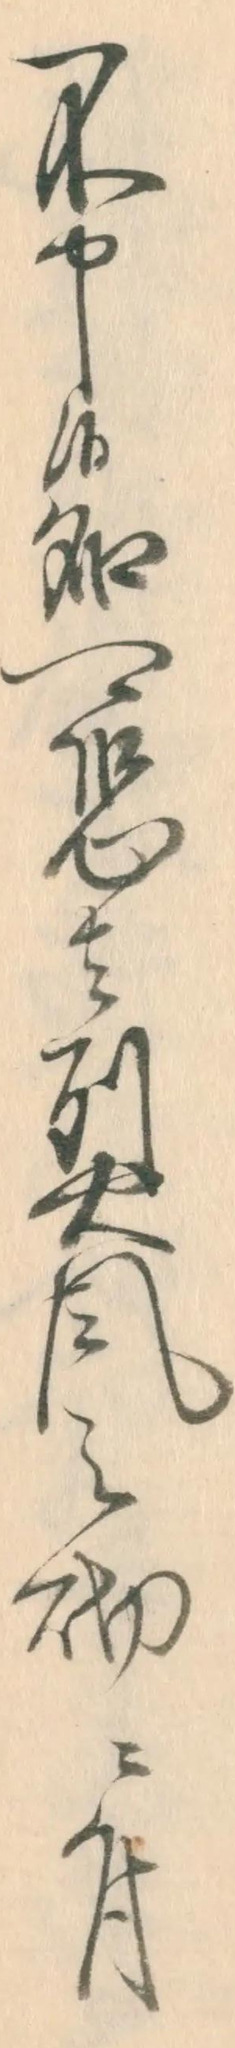不申候処可恐は烈風之砌ニ付
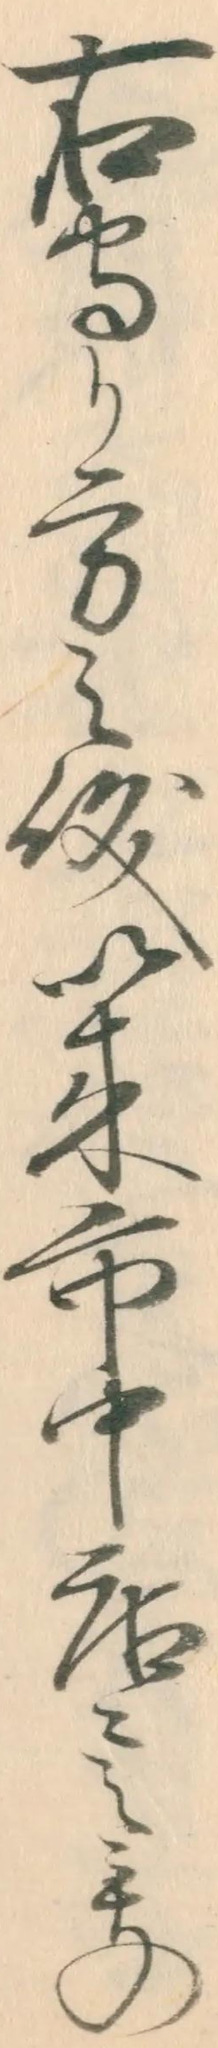右守り方之儀以来市中店々之もの
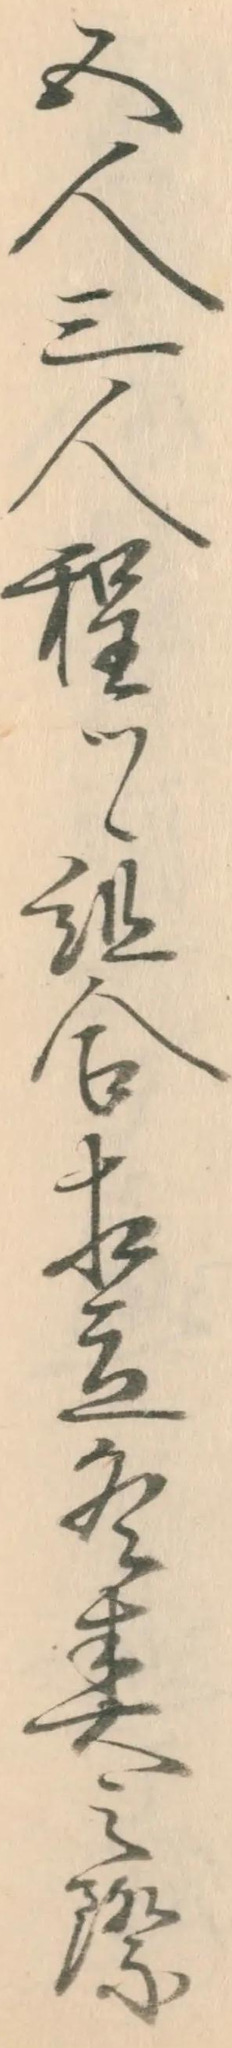五人三人程ツヽ組合相立冬春之際
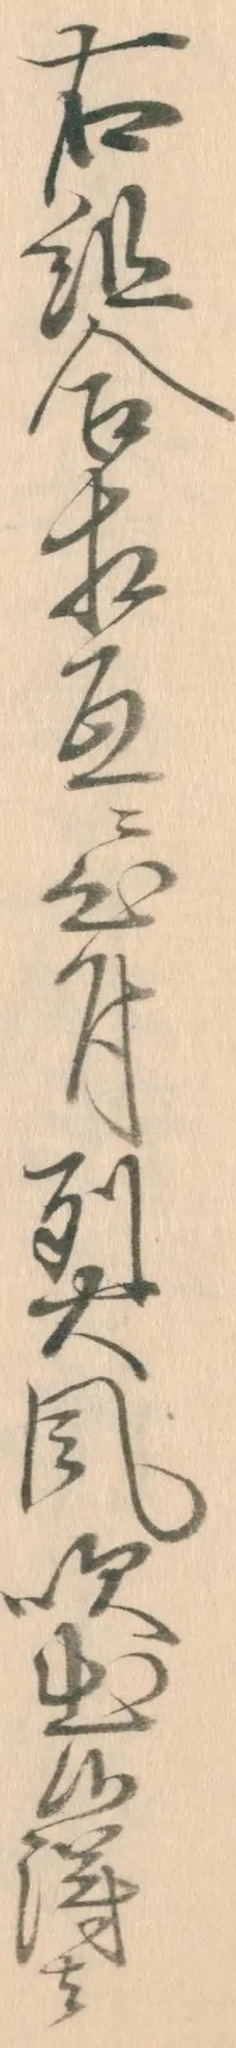右組合相互ニ心付烈風吹出候得は
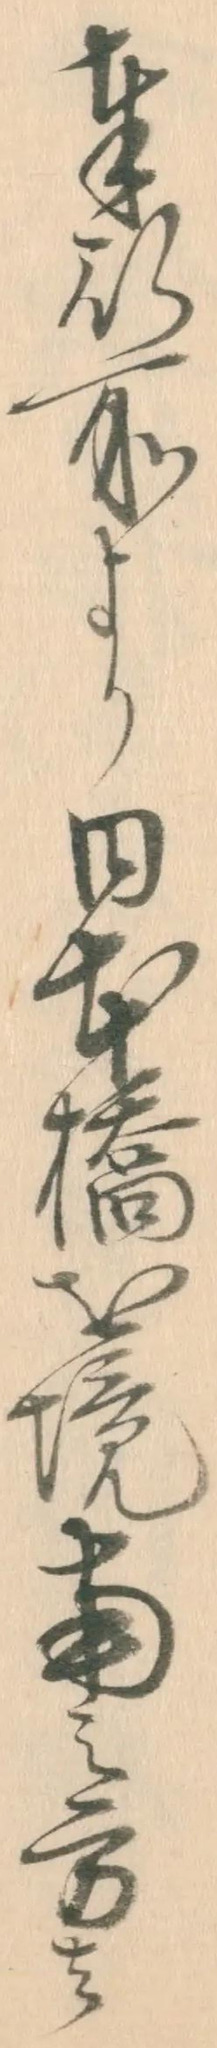奉行所より日本橋を境南之方は
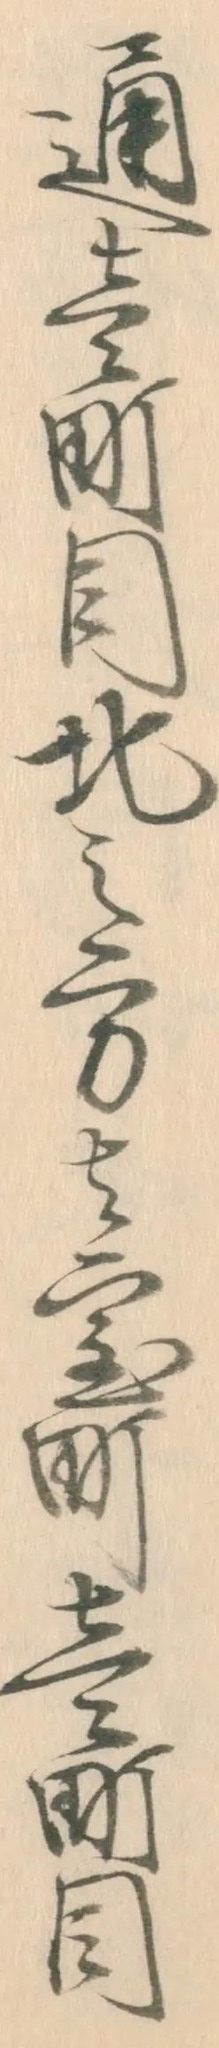通壱丁目北之方は室町壱丁目
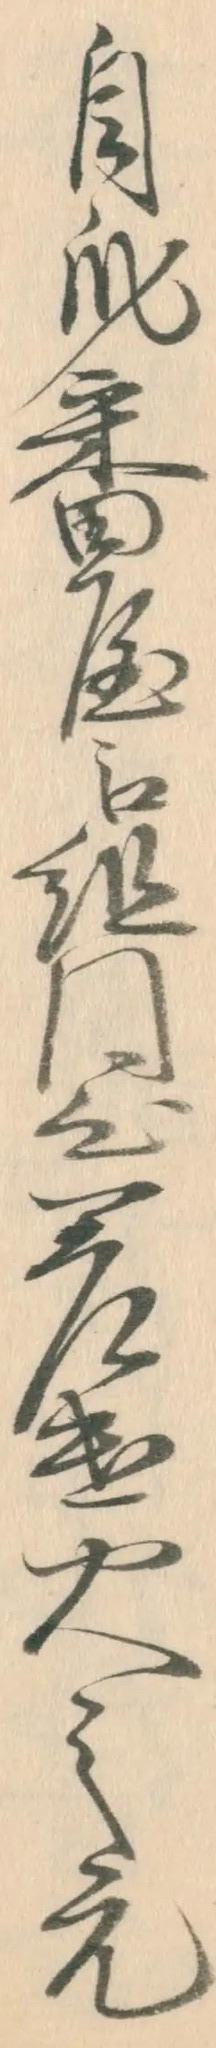自然番屋え組同心差遣火之元
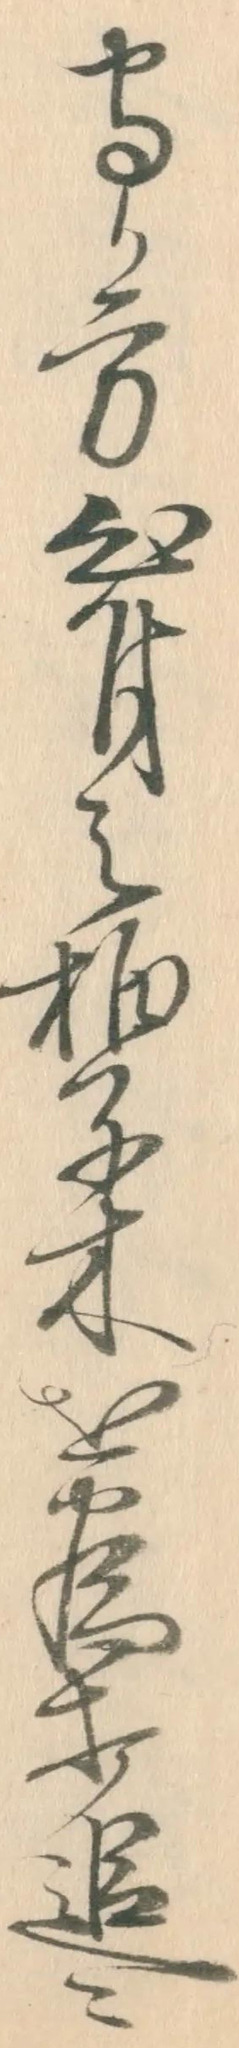守り方心付之拍子木を為打追々

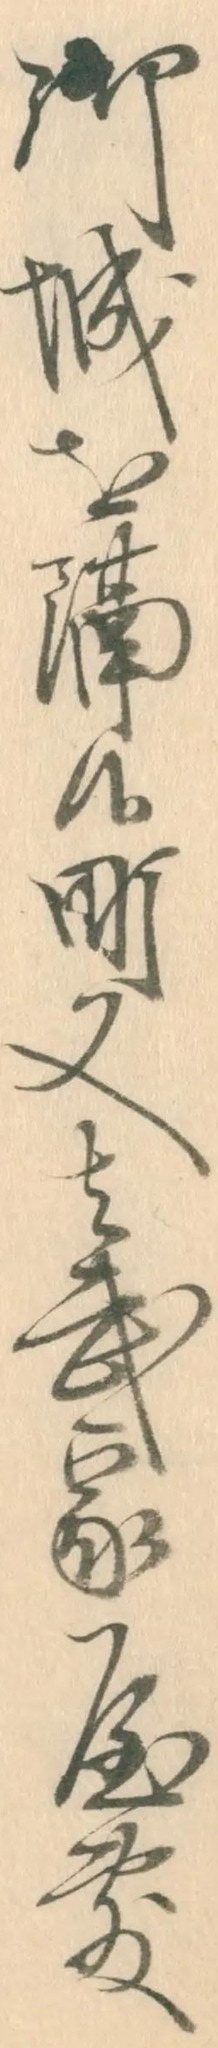御城を隔候町又は武家屋敷
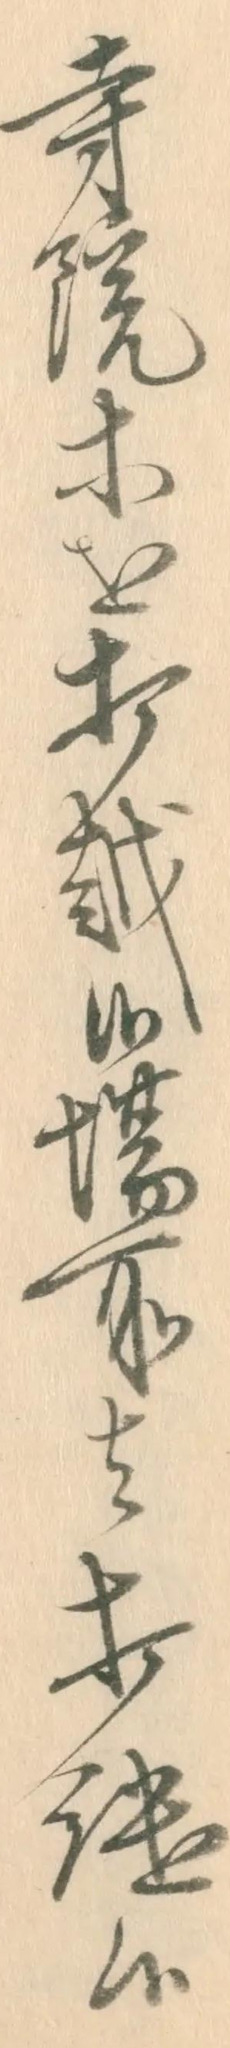寺院等を打越候場所は打継候
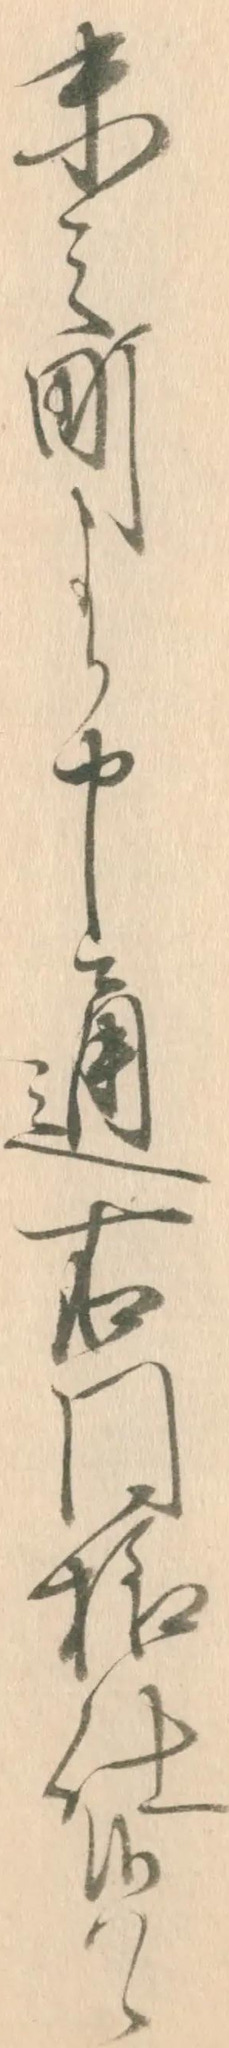末之町より申通右同様仕候ハヽ
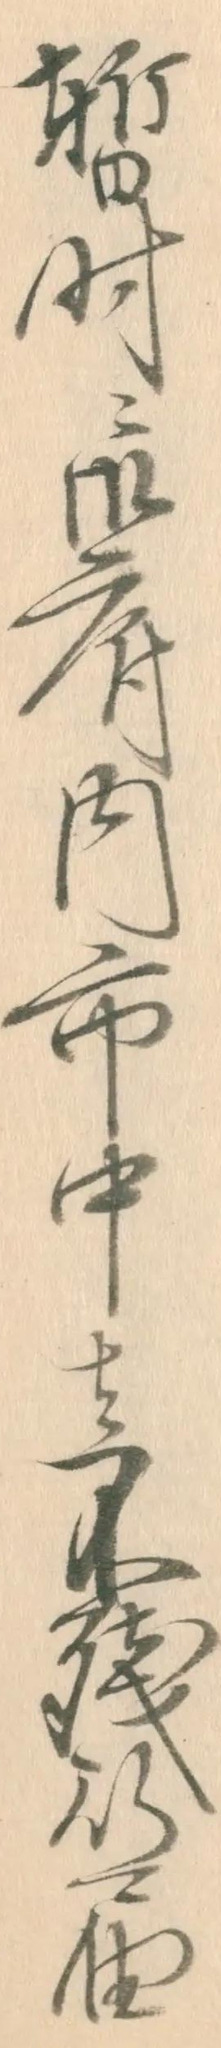暫時ニ御府内市中は不残行届
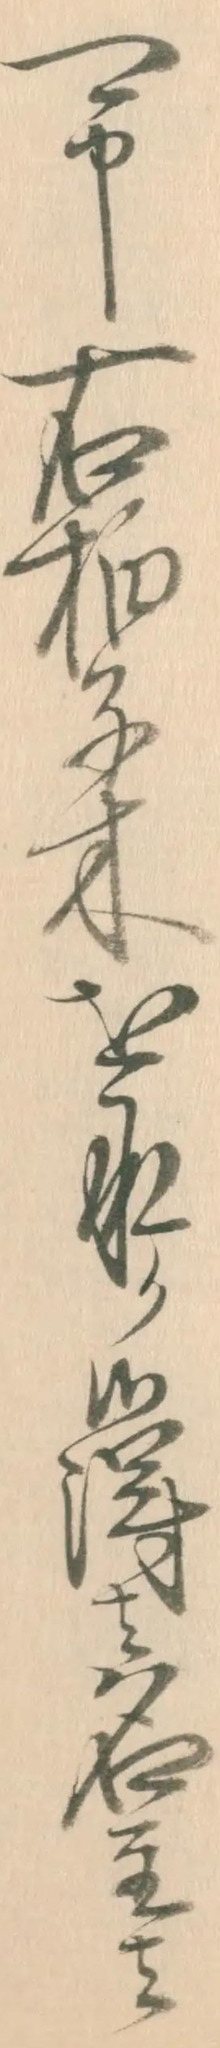可申右拍子木を承り候得は名主は
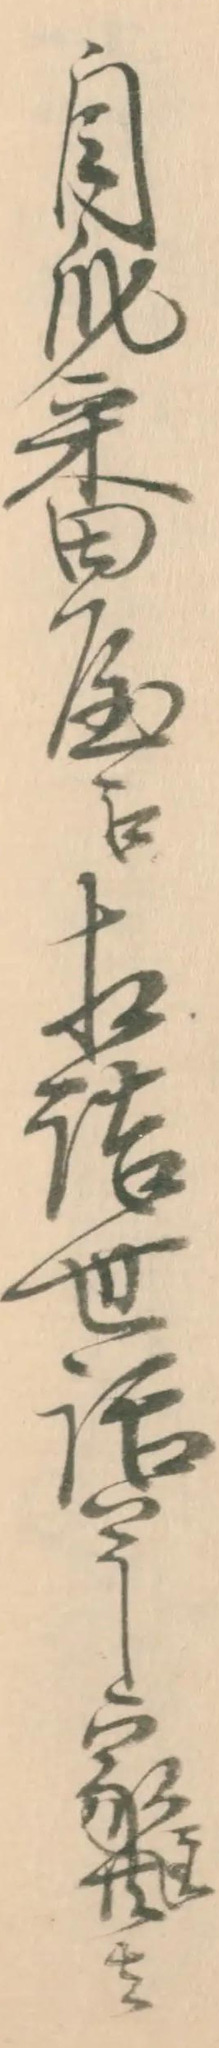自身番屋え相詰世話いたし家主共は
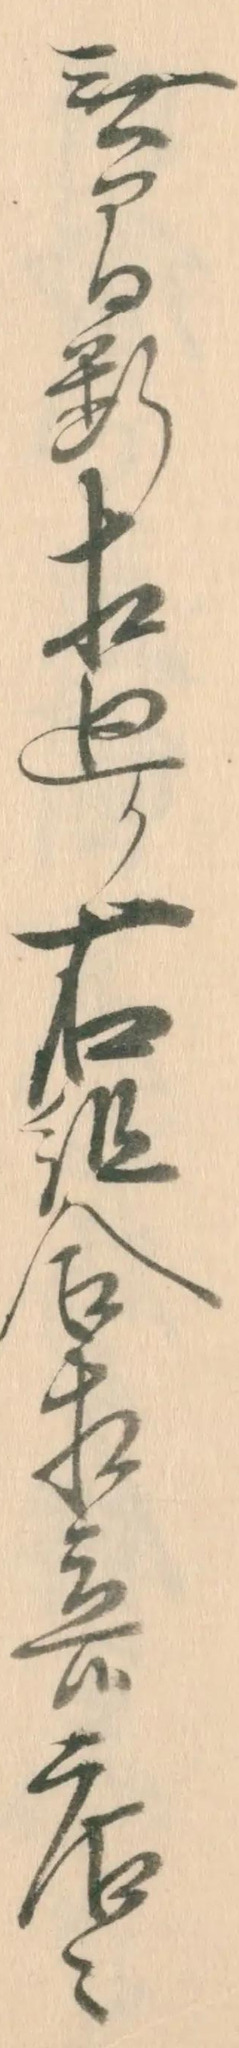無間断相廻り右組合相立候店々
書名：三橋 17巻. [7] 三橋小破御修復書留　但御奉行御掛リ替地震潰橋番屋　嘉永四亥年より安政二卯年迄　上
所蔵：国立国会図書館 National Diet Library, JAPAN
